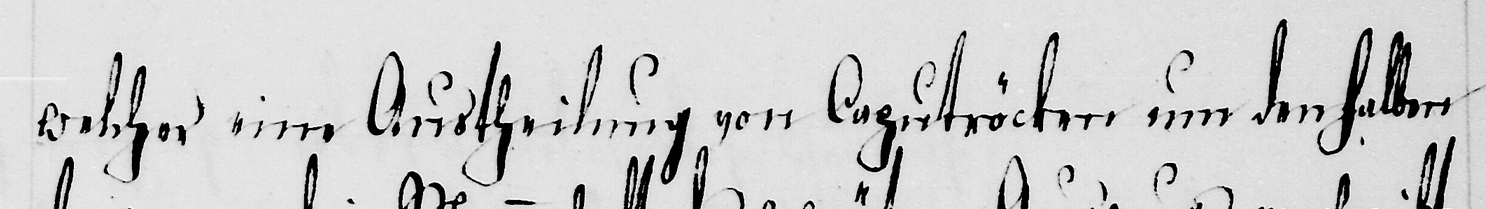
welcher eine Austheilung von Caputröcken um den halben
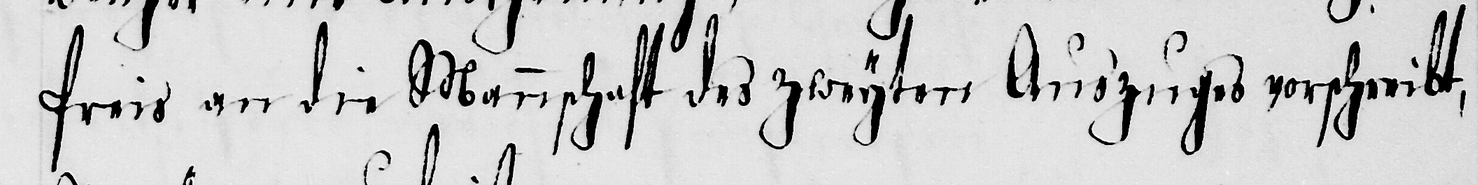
Preis an die Mannschaft des zweyten Auszuges vorschreib¬
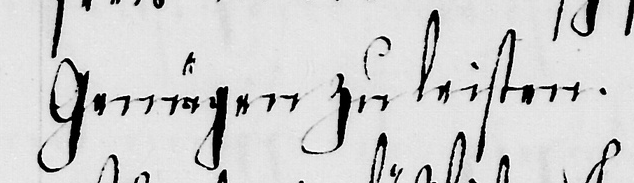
Genügen zu leisten.
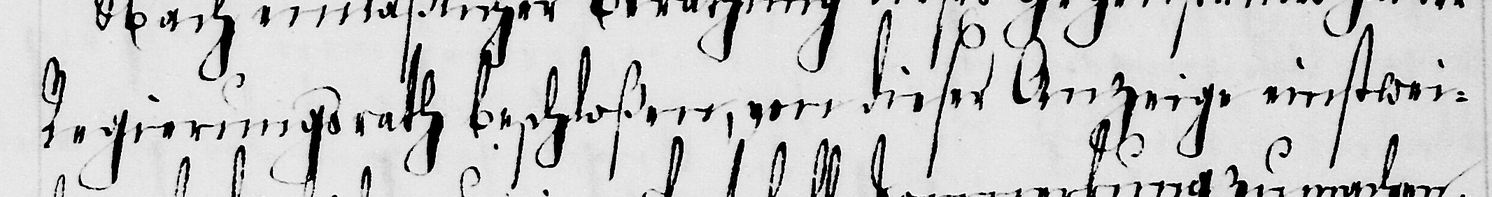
Regierungsrath beschloßen, von dieser Anzeige einstwei¬
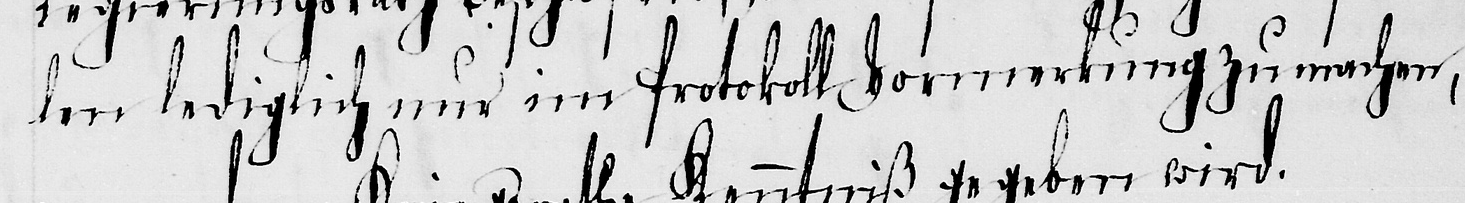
len lediglich nur im Protokoll Vormerkung zu machen,
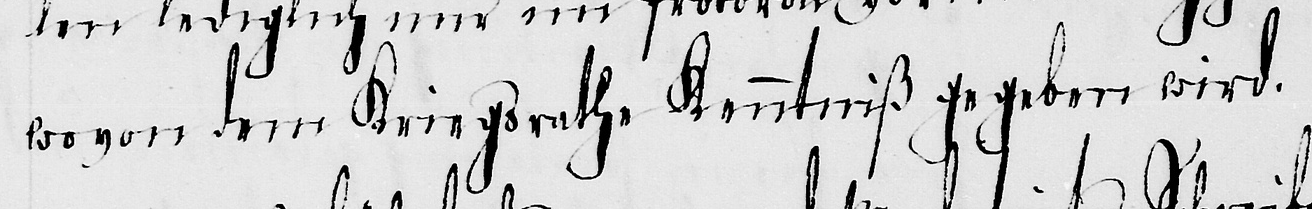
wovon dem Kriegsrathe Kenntniß gegeben wird.
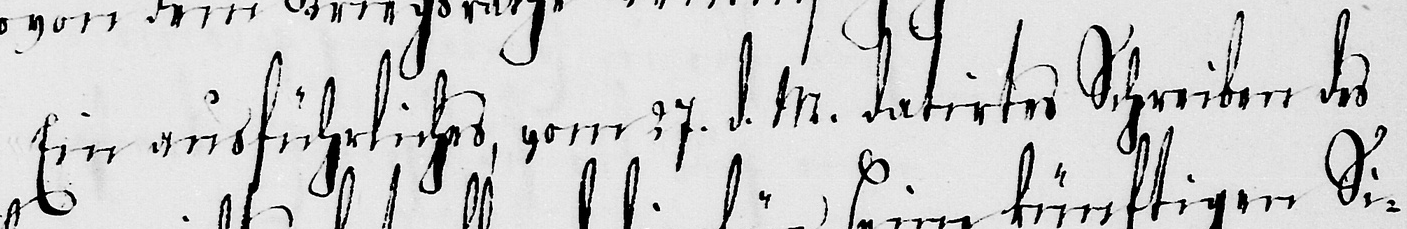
Ein ausführliches, vom 27. d. M. datirtes Schreiben des
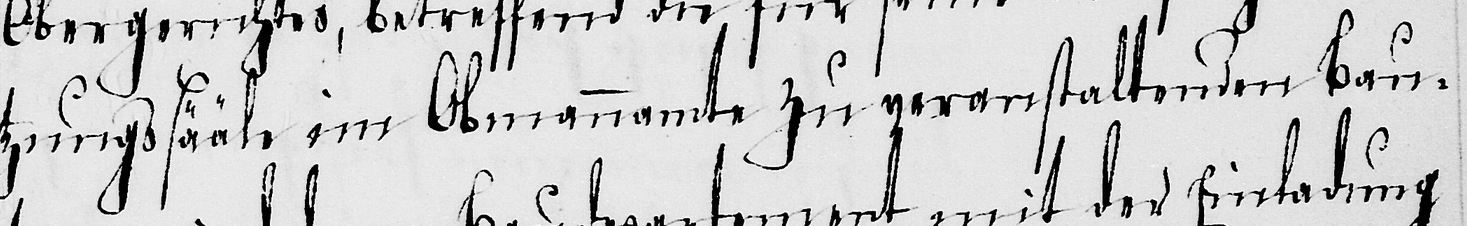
zungssääle im Obmannamte zu veranstaltenden Bau¬
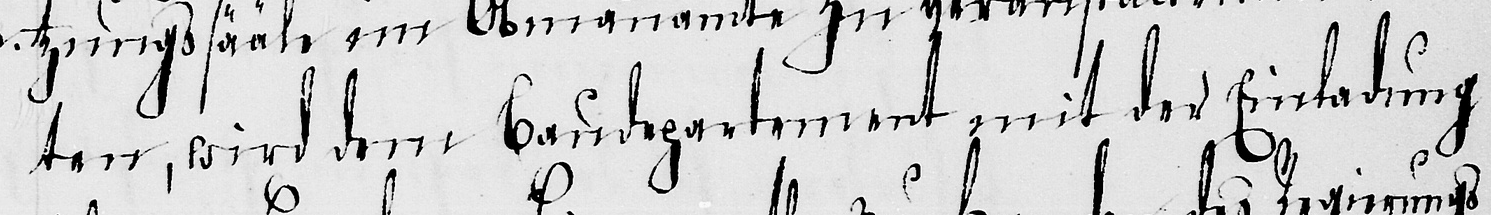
ten, wird dem Baudepartement mit der Einladung
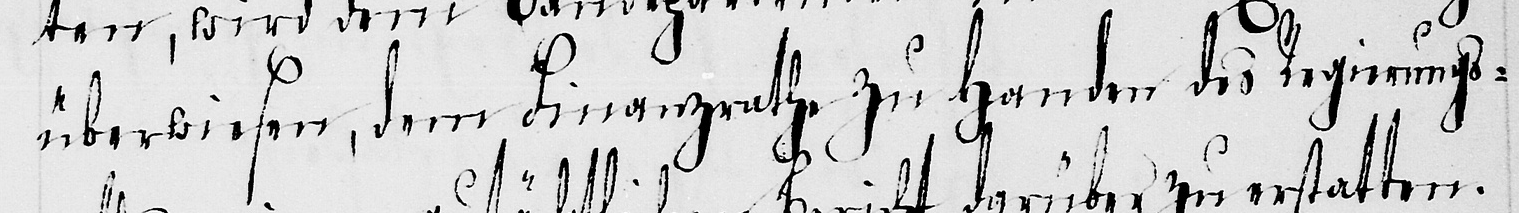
überwiesen, dem Finanzrathe zu Handen des Regierungs¬
